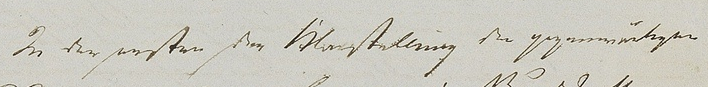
In der ersten der Klarstellung der gegenwärtigen
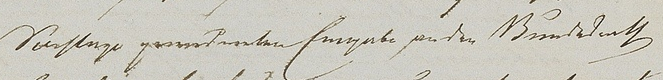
Sachlage gewidmeten Eingabe an den Bundesrath
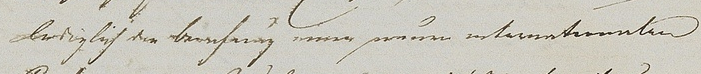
lediglich die Berufung einer neuen internationalen
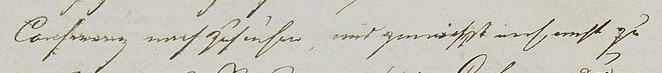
Conferenz nachzusuchen, und zunächst noch nicht zu
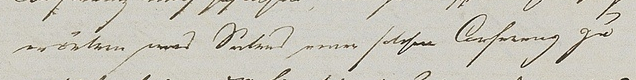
erörtern was Seitens einer solchen Conferenz zu
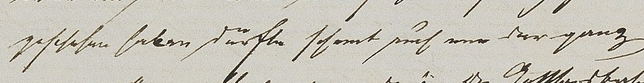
geschehen haben dürfte scheint auch mir der ganz
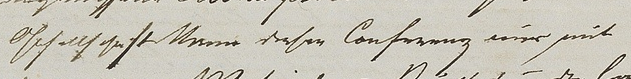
Gesellschaft kann dieser Conferenz nur mit
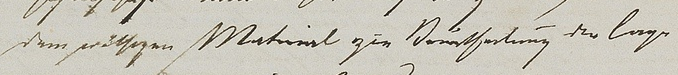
dem nöthigen Material zur Beurtheilung der Lage
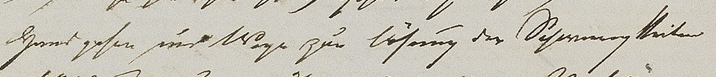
Hand gehen und Wege zur Lösung der Schwierigkeiten
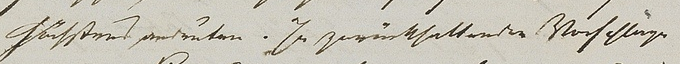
höchstens andeuten. Je zurückhaltender Vorschläge
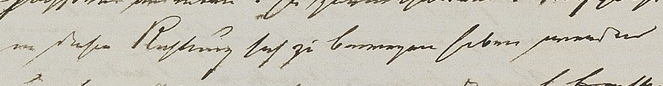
in dieser Richtung sich zu bewegen haben werden
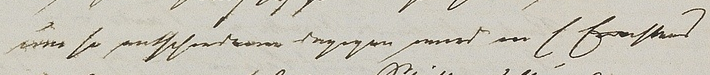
um so entschiedener dagegen wird meines Erachtens
